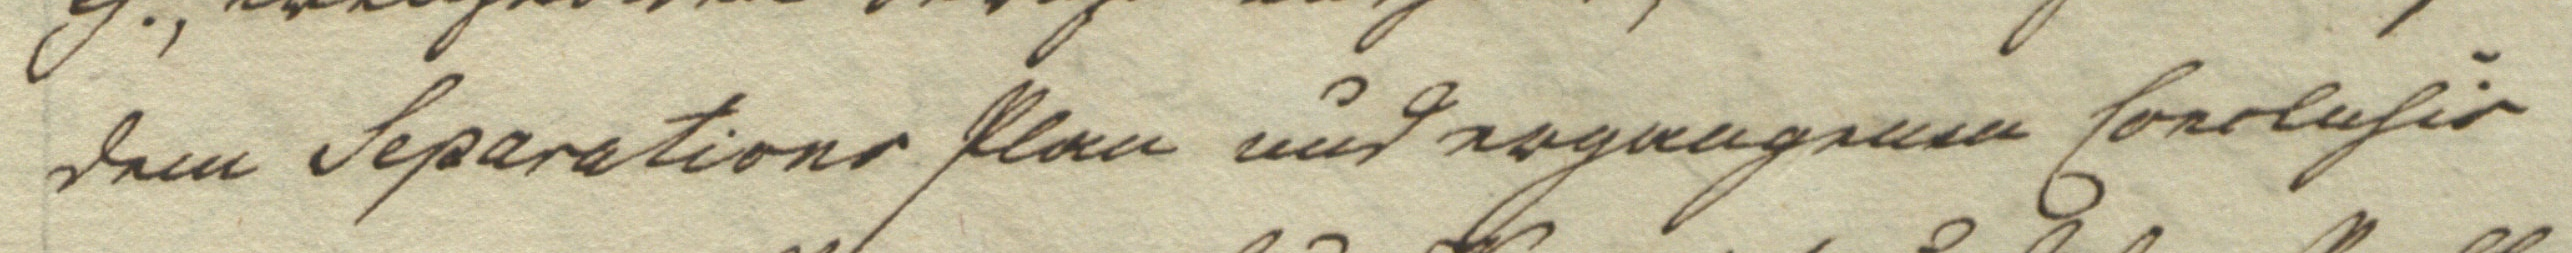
dem Separations Plan und ergangene Conclusis
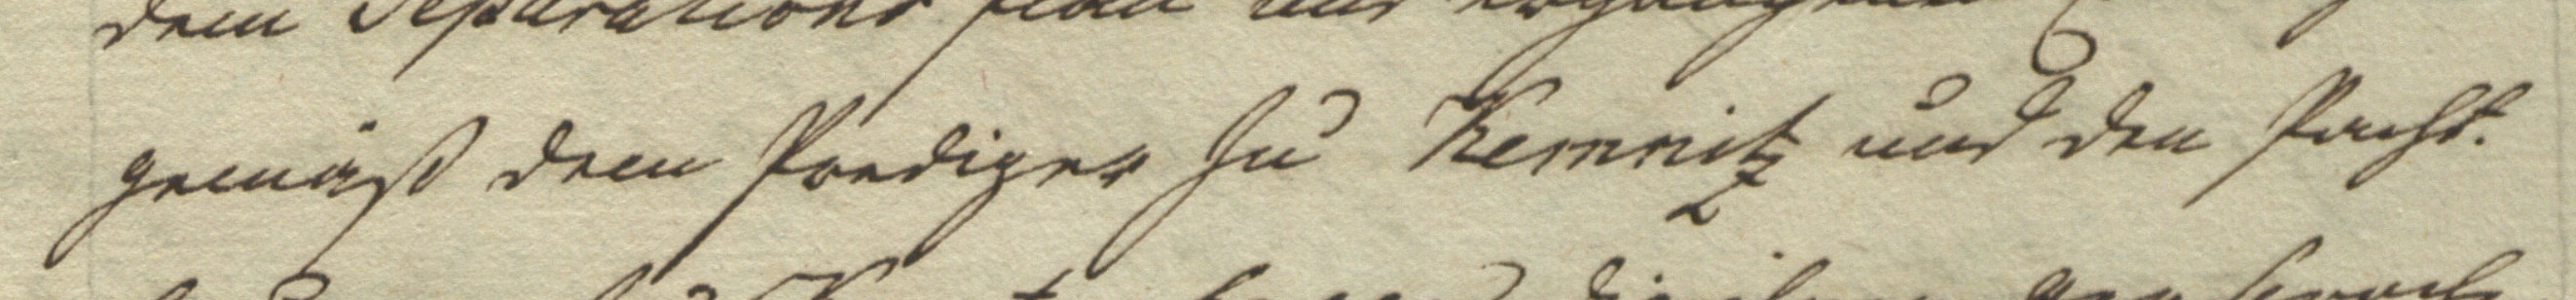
gemäß dem Prediger zu Kemnitz und den Pacht¬
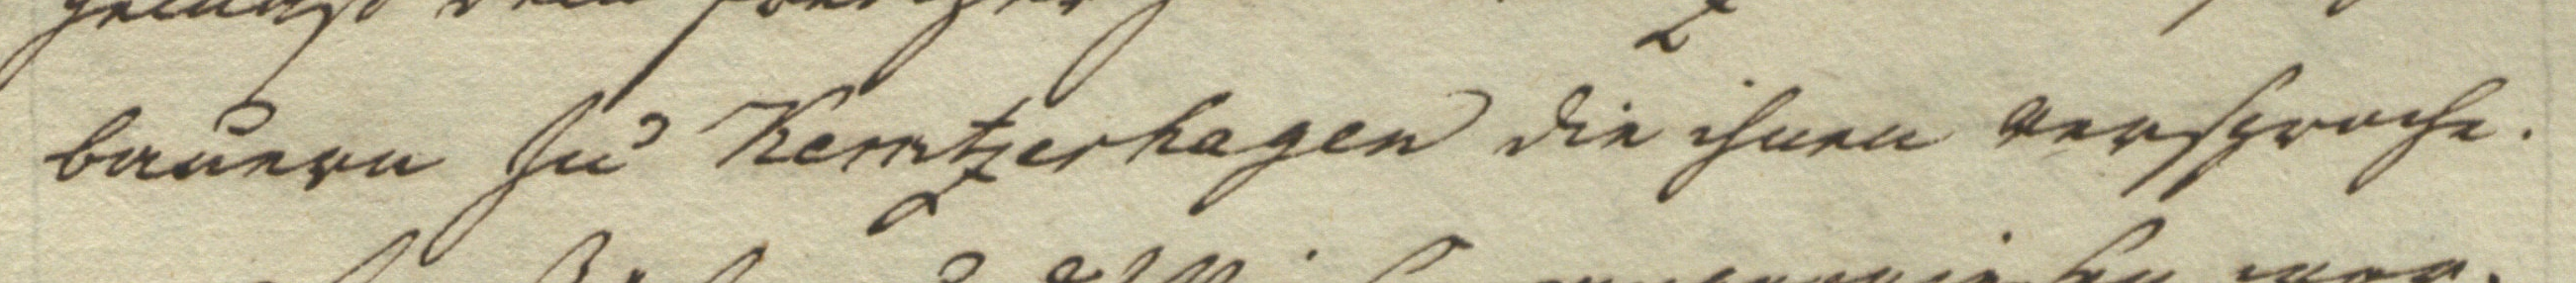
bauern zu Kemtzerhagen die ihnen versproche¬
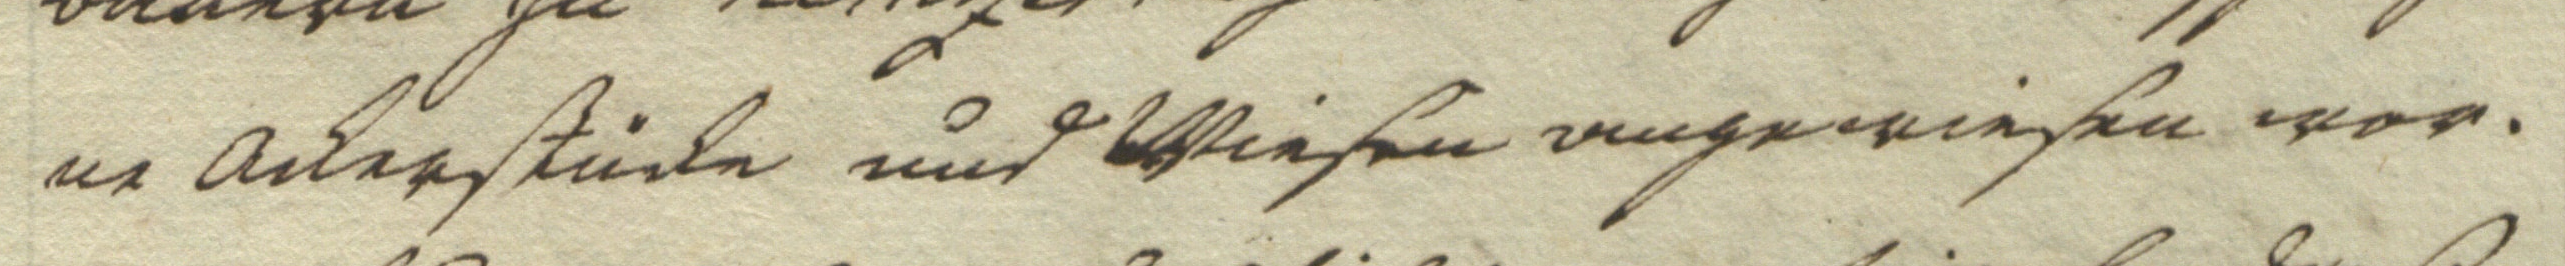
ne Ackrstücke und Wiesen angewiesen wor¬
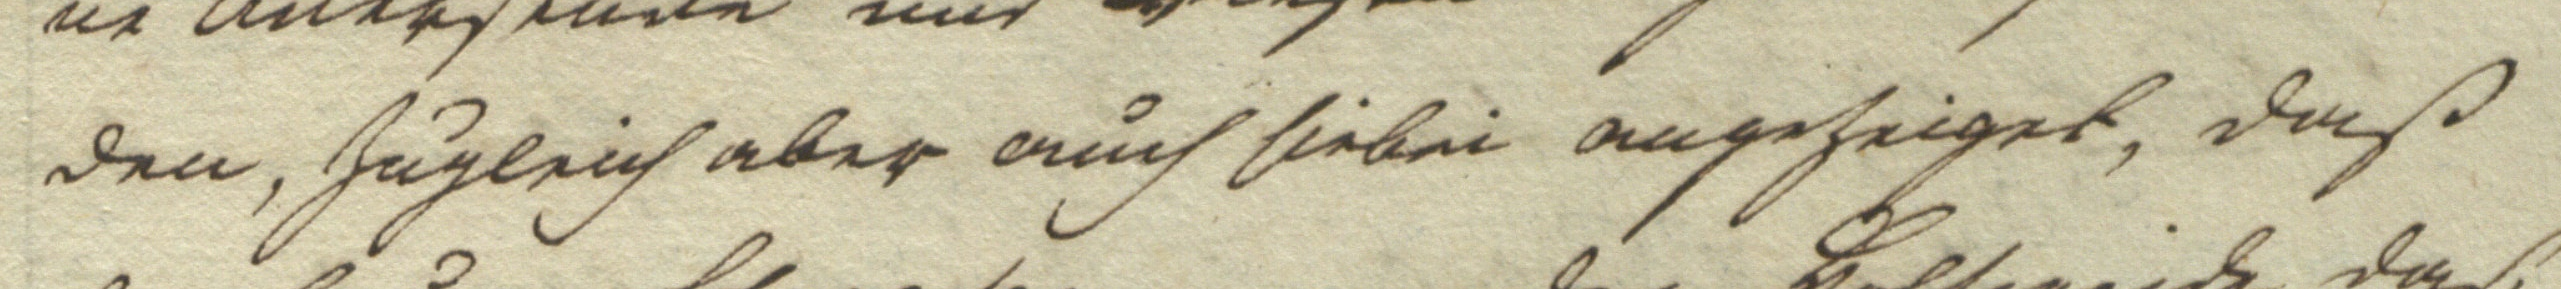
den, zugleich aber auch hiebei angezeiget, daß
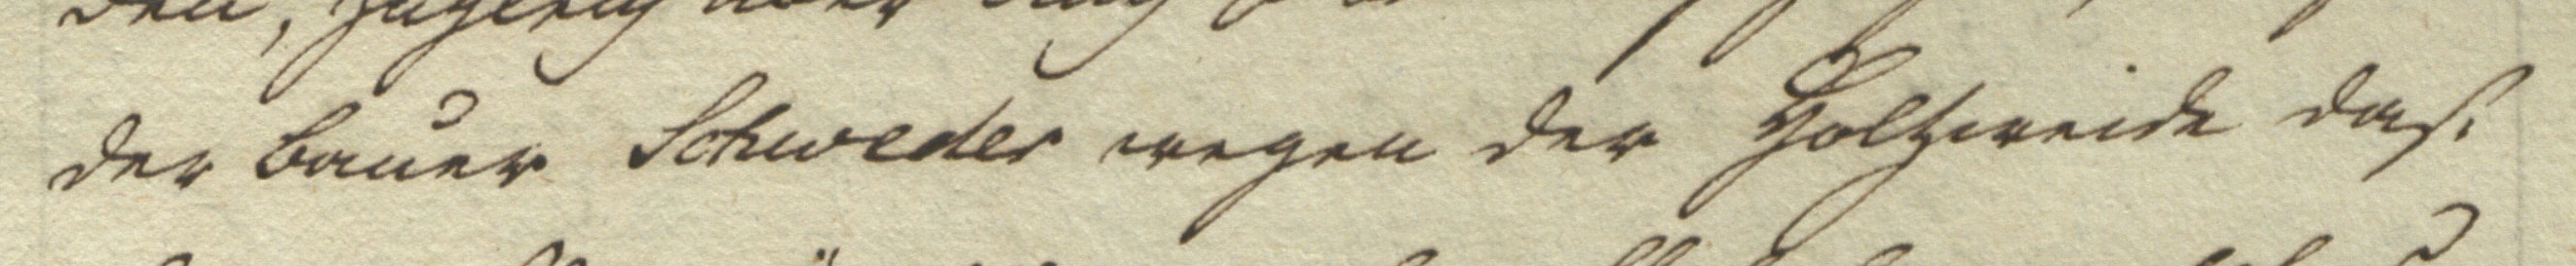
der Bauer Schweder wegen der Holzweide das¬
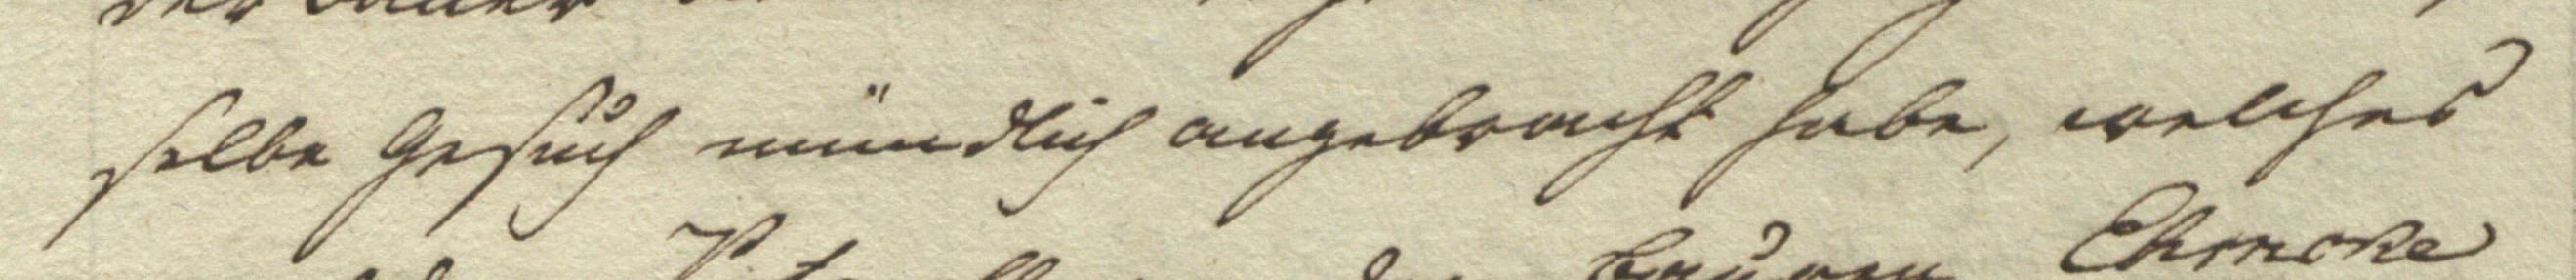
selbe Gesuch mündlich angebracht habe, welches
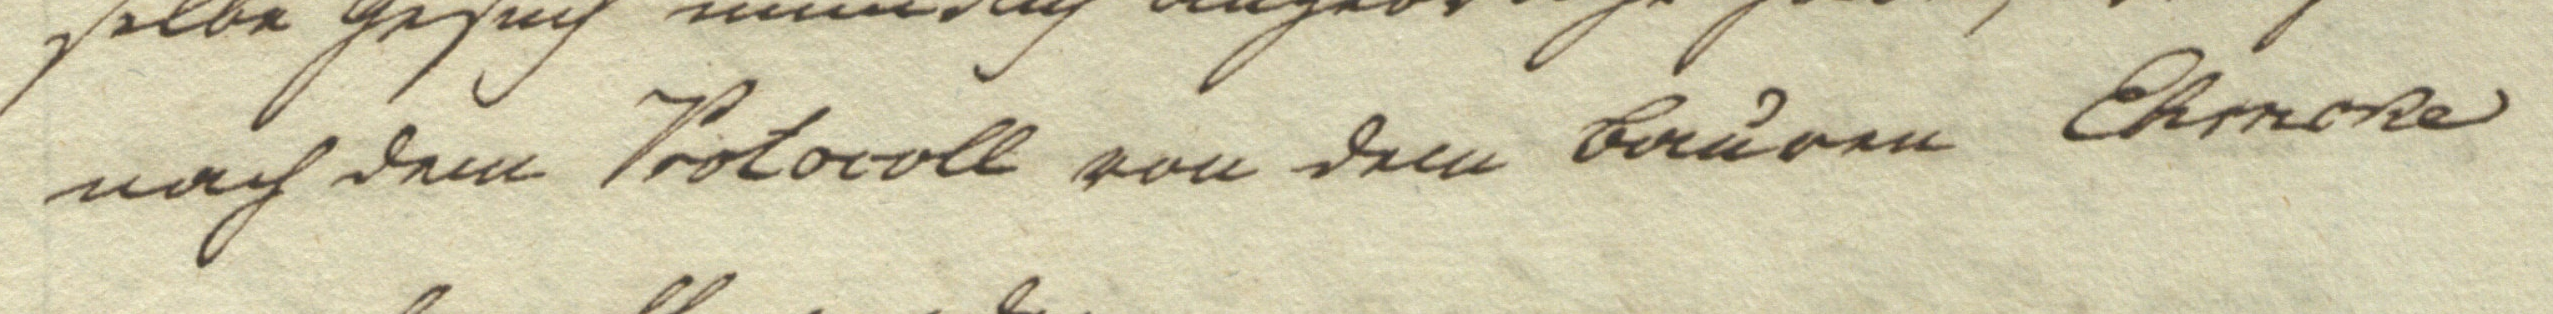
nach dem Protocoll von dem Bauren Ehmcke
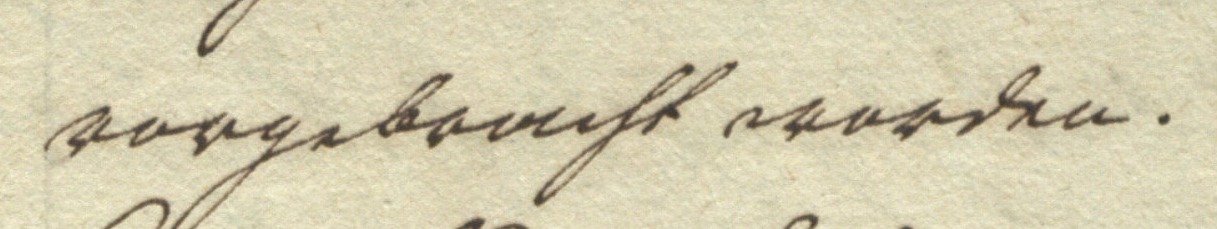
vorgebacht worden.
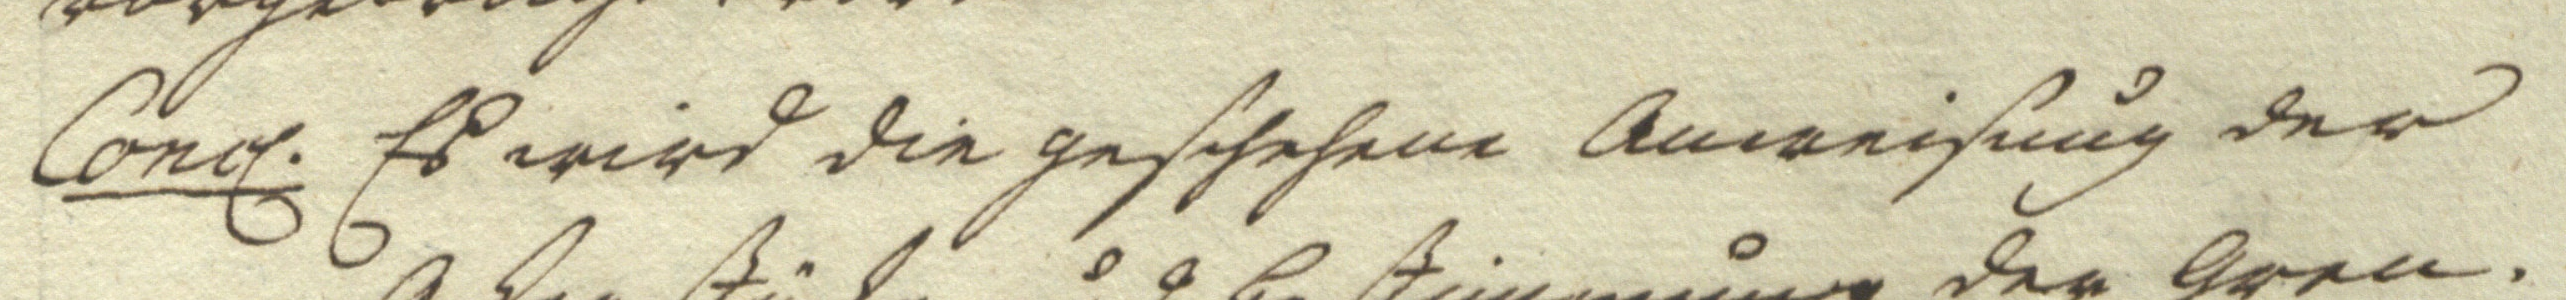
Concl. Es wird die geschehene Anweisung der
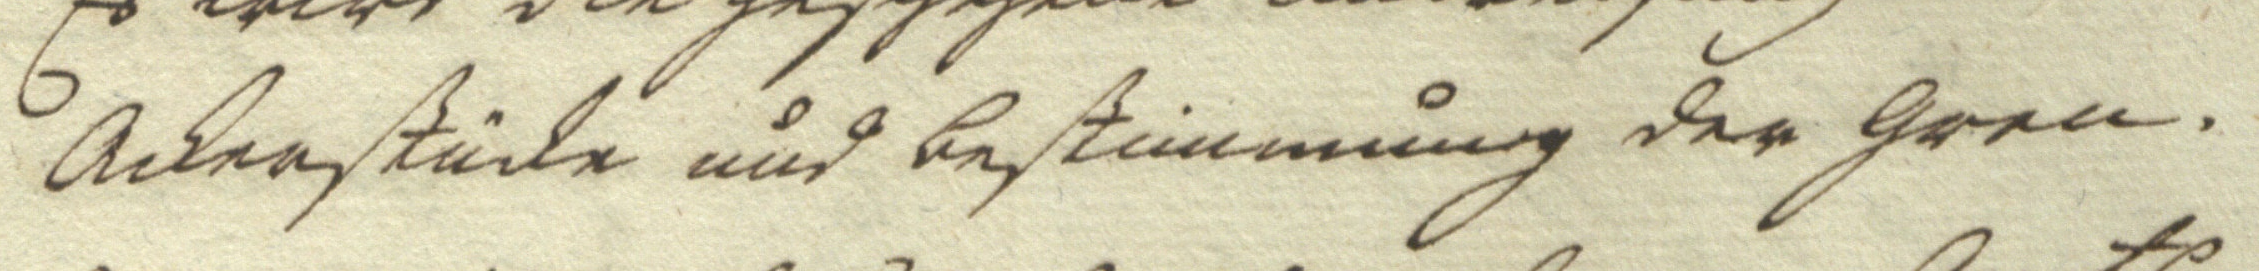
Ackerstücke und Bestimmung der Gren¬
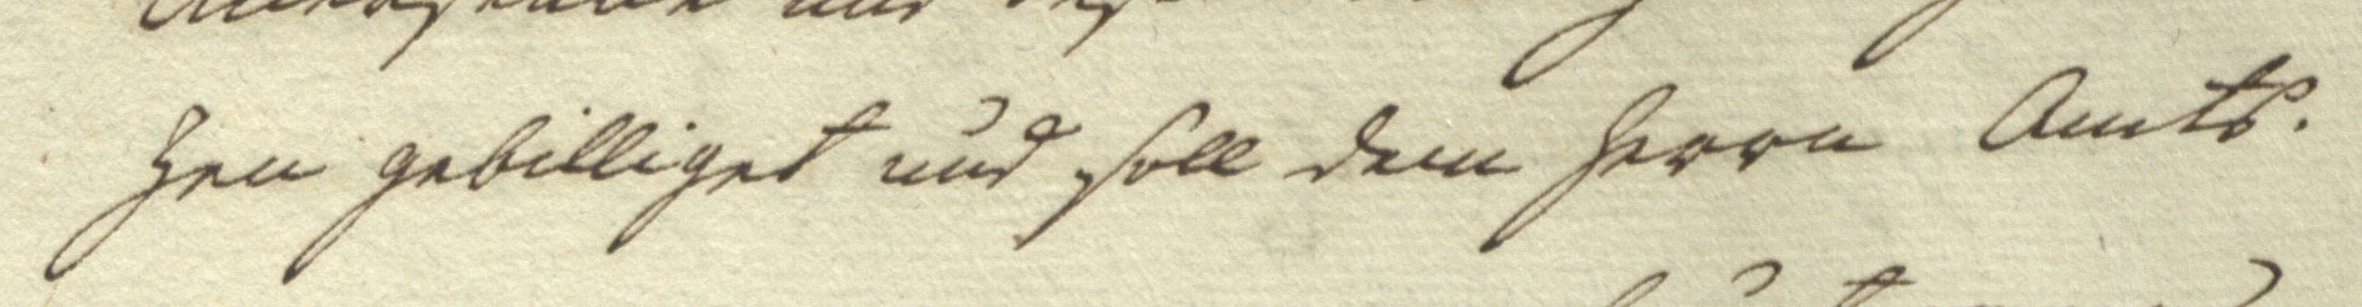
zen gebilliget und soll dem Herrn Amts¬
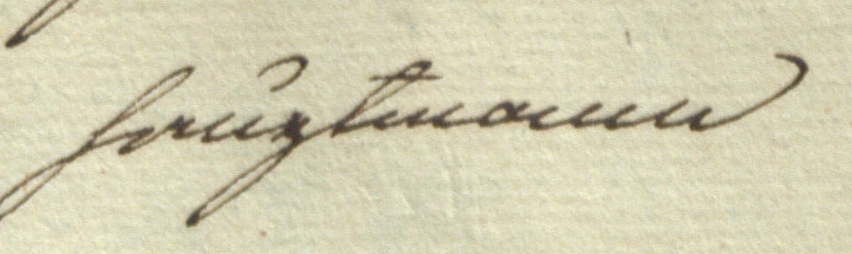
hauptmann
